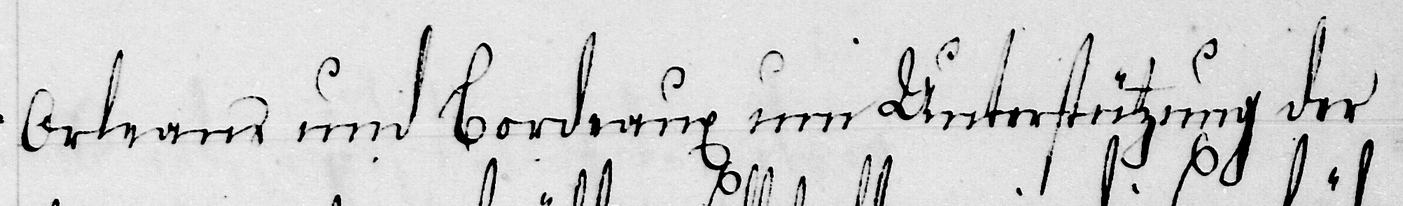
Orleans und Bordeaux um Unterstützung der
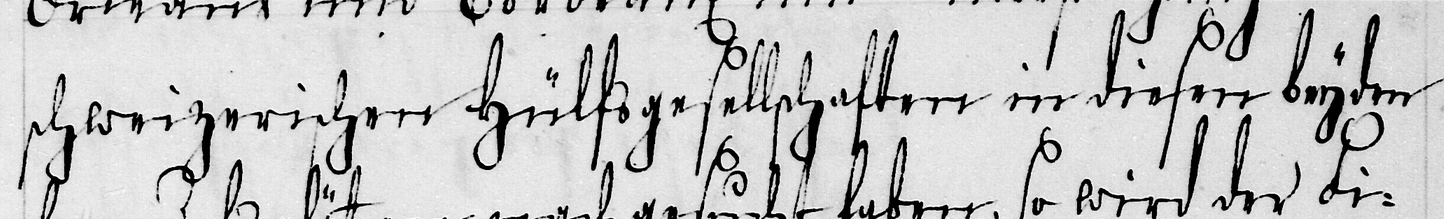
schweizerischen Hülfsgesellschaften in diesen
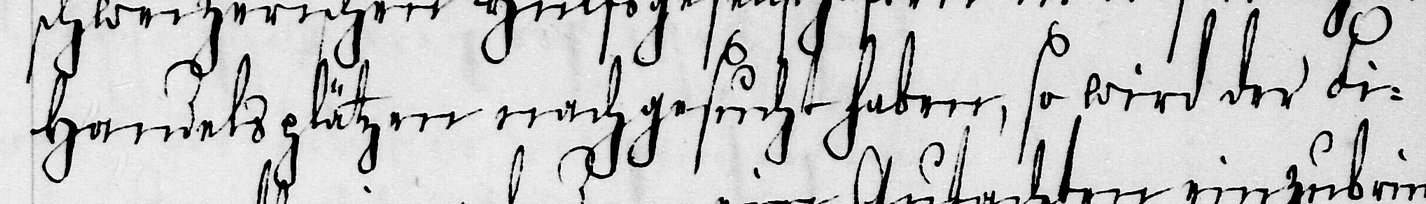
Handelsplätzen nachgesucht haben, so wird der Fi¬
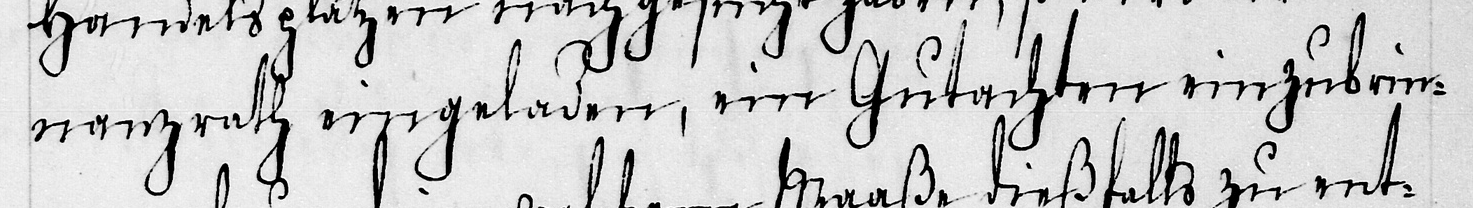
nanzrath eingeladen, ein Gutachten einzubrin¬
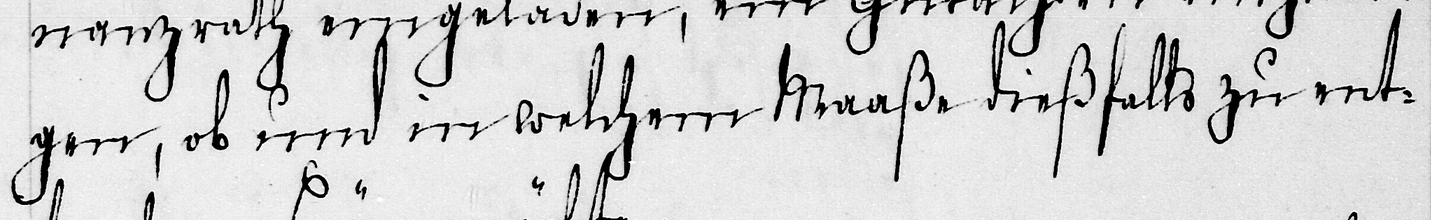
gen, ob und in welchem Maaße dießfalls zu ent¬
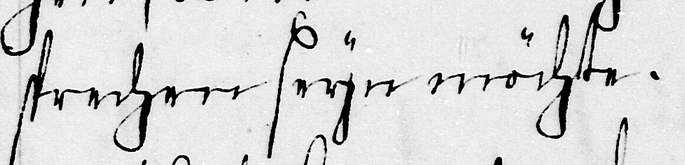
sprechen seyn möchte.
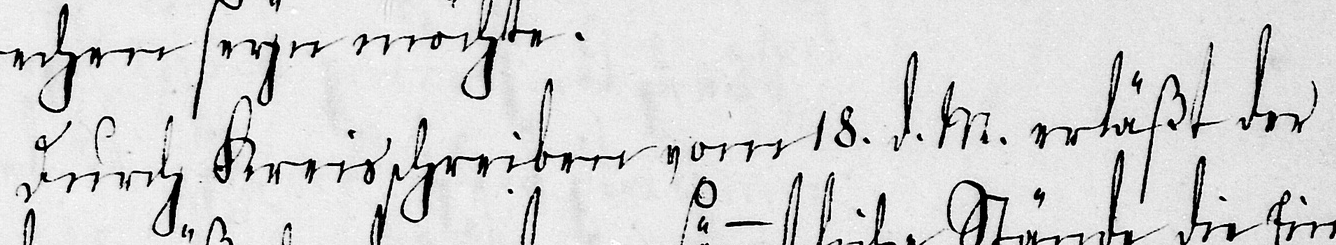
Durch Kreisschreiben vom 18. d. M. erläßt der
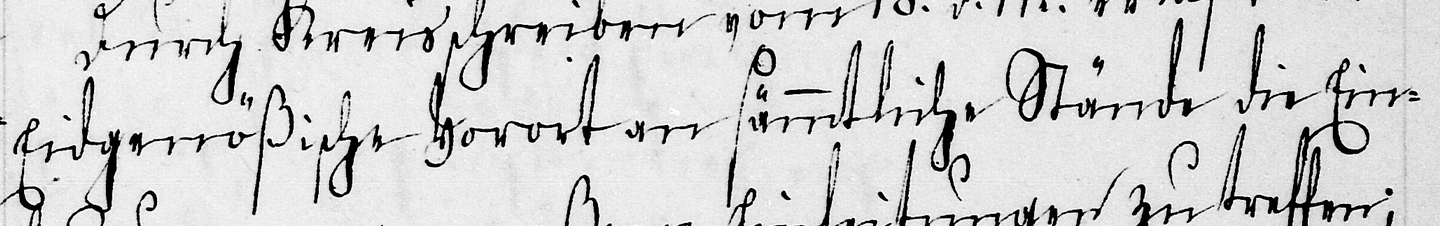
Eidgenößische Vorort an sämmtliche Stände die Ein¬
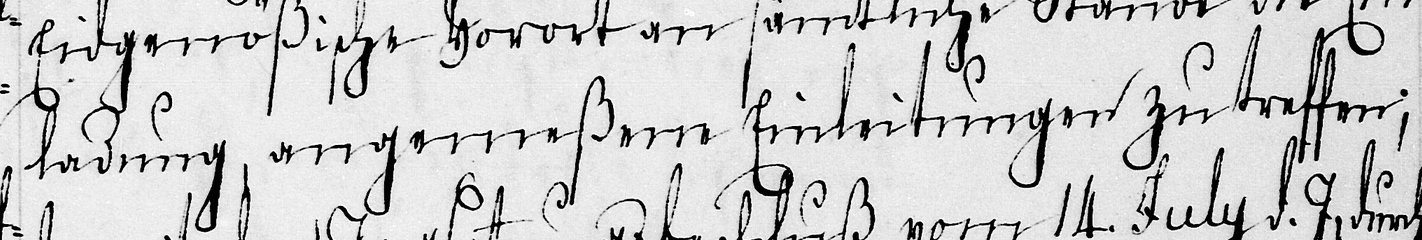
ladung, angemeßene Einleitungen zu treffen,
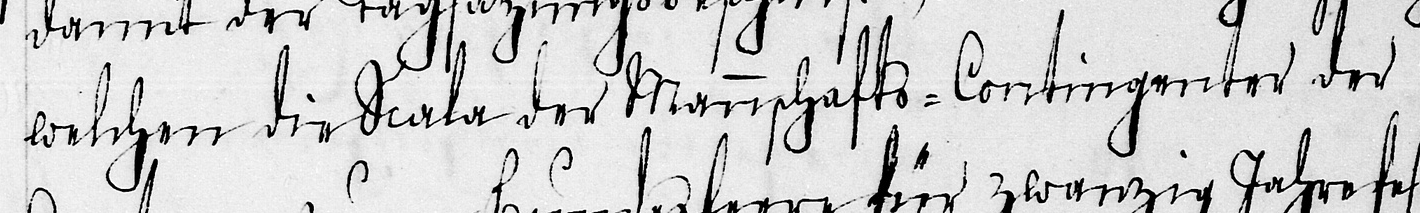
welchen die Scala der Mannschafts-Contingenter der
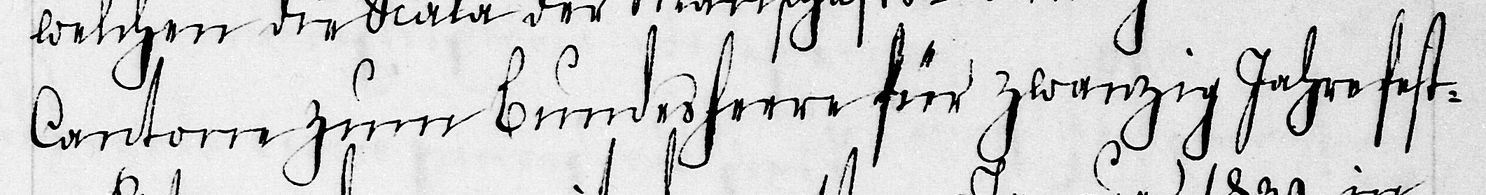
Cantone zum Bundesheere für zwanzig Jahre fest¬
